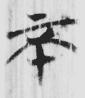不
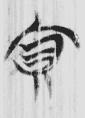{宀貝}
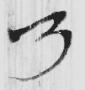乃
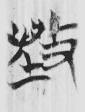毀
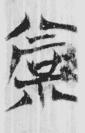常
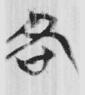各
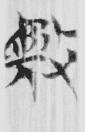敄
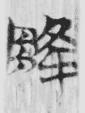降
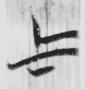上
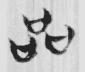品
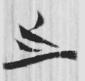之
